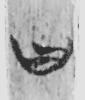曰
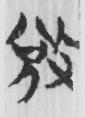敓（說）
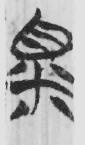眔
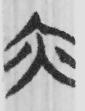亦
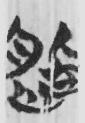{脂臼}
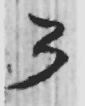乃
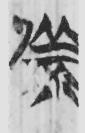備
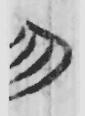勿
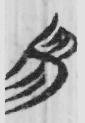易
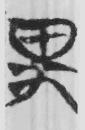卑
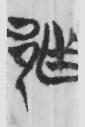{戉阝}
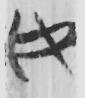女
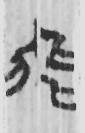飛
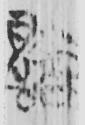{雀鳥}
